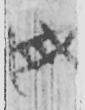母
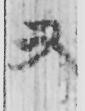又
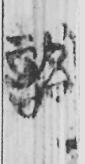{言咎}
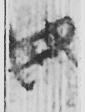母
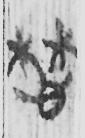惏
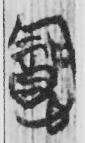{酓心}
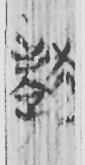{孝犬}
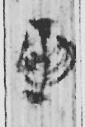昆
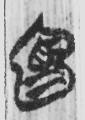{囗馬}
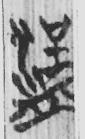{浧皿}
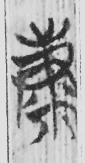康
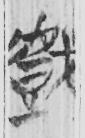戲
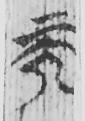而
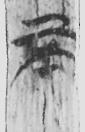不
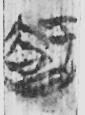智
